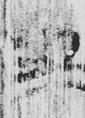爲
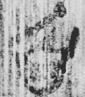首
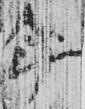身
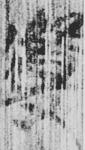○（且）
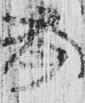有
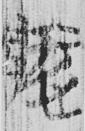○（病）
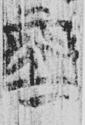亞（惡）
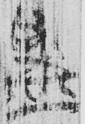○（菜）
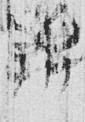與
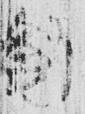飤（食）
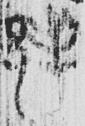邦
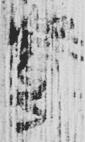○（且）
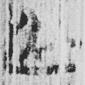亡
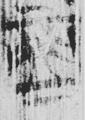亞（惡）
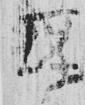聖
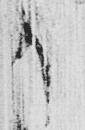人
